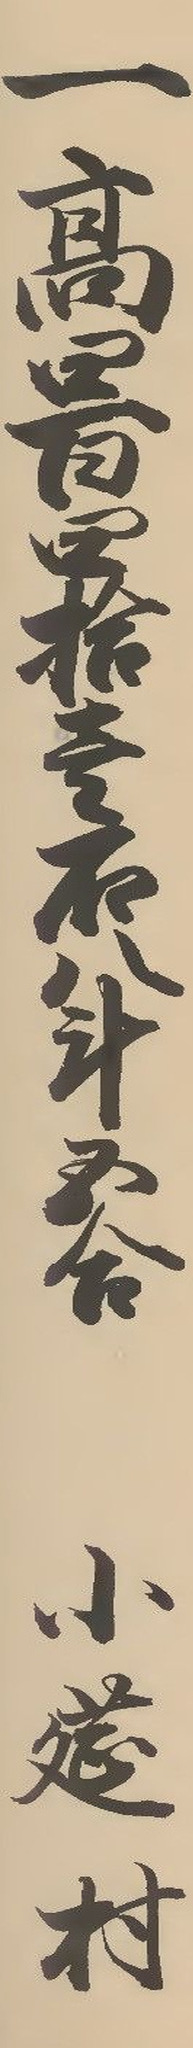一髙四百四拾壱石八斗五合小筵村
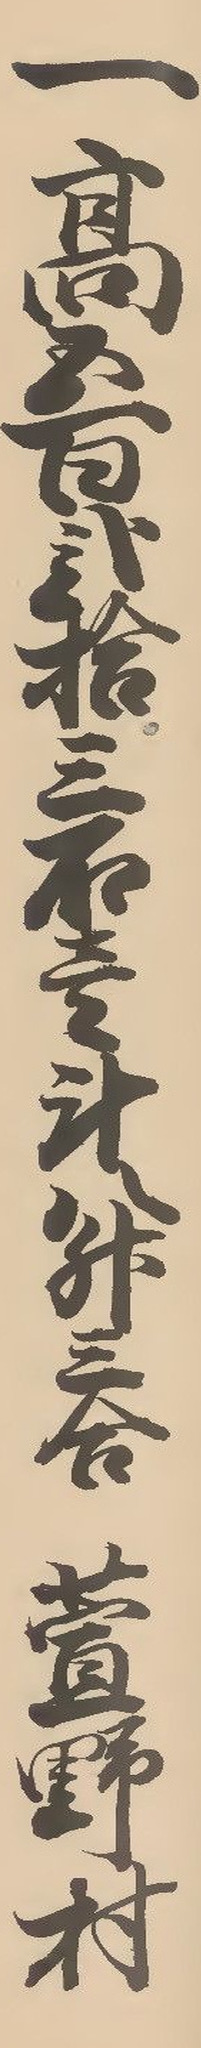一髙五百弐拾三石壱斗八升三合菅野村
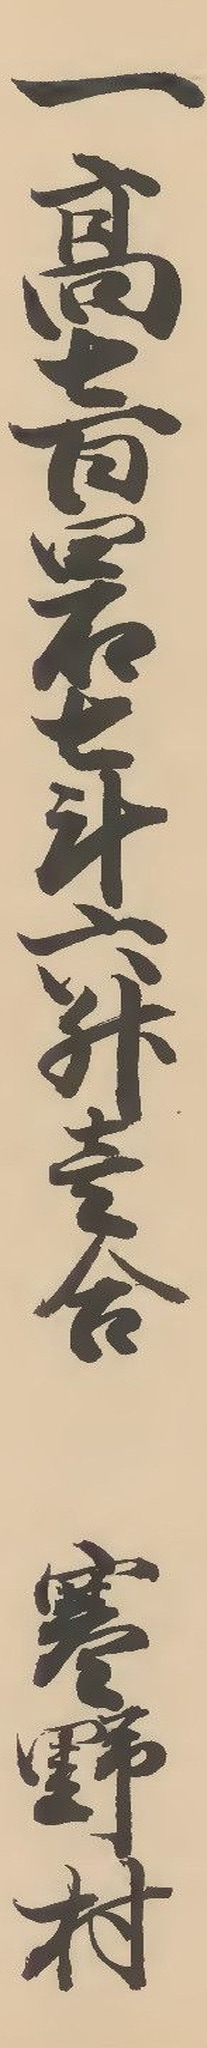一髙七百四石七斗六升壱合寒野村
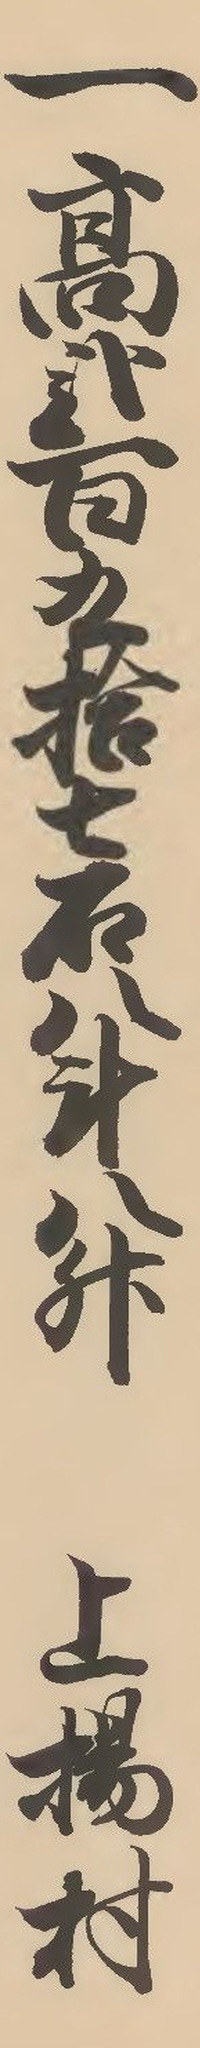一髙弐百九拾七石八斗八升上揚村
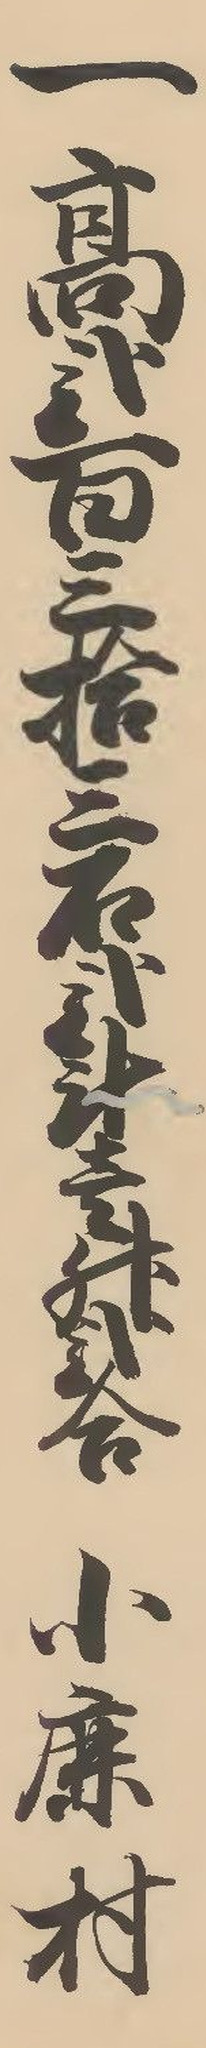一髙弐百三拾三石弐斗壱升弐合小鹿村

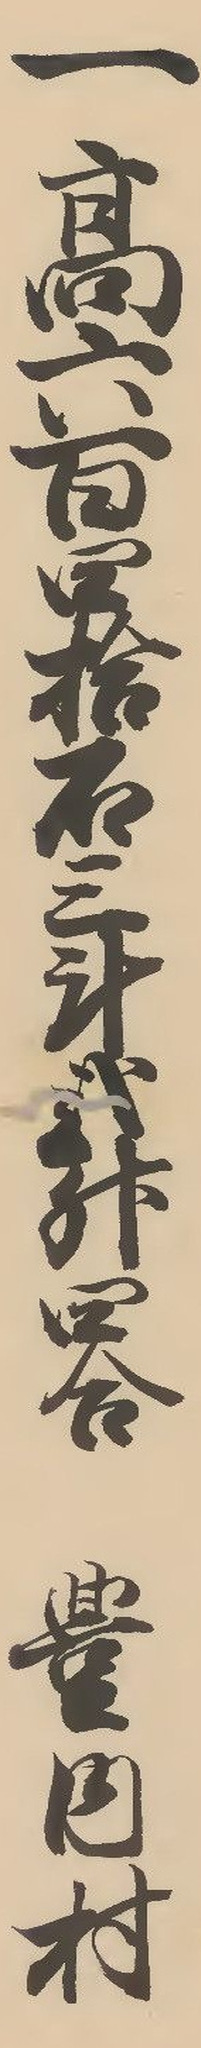一髙六百四拾石三斗弐升四合豊内村
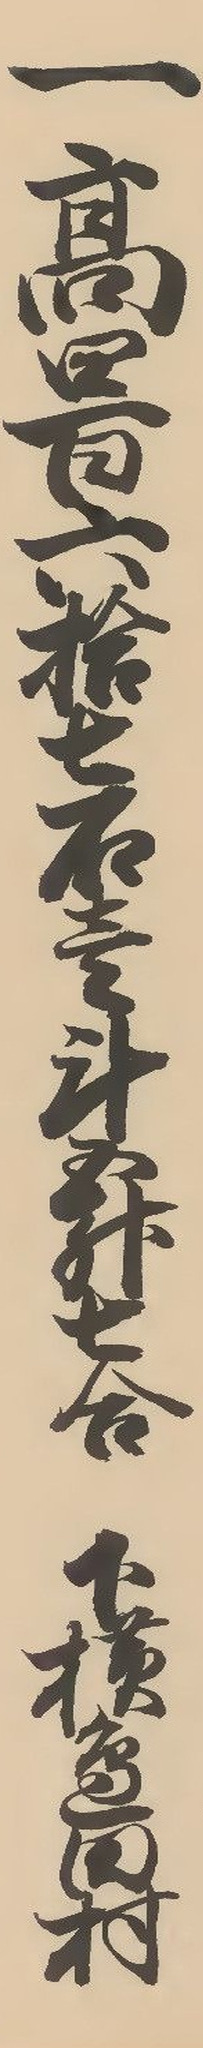一髙四百六拾七石壱斗五升七合下横辺田村
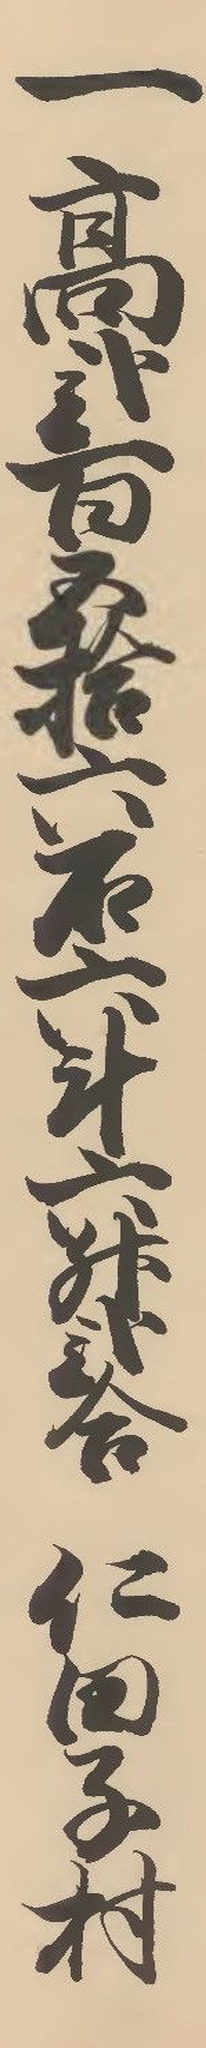一髙弐百五拾六石六斗六升弐合仁田子村
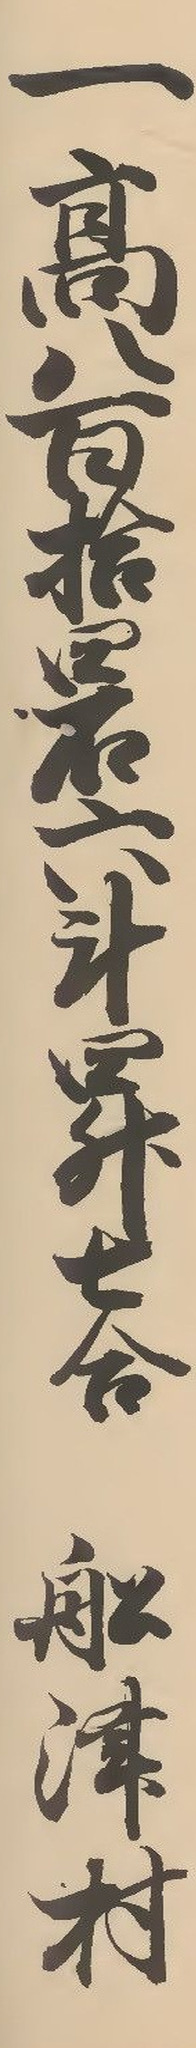一髙八百拾四石六斗四升七合舩津村
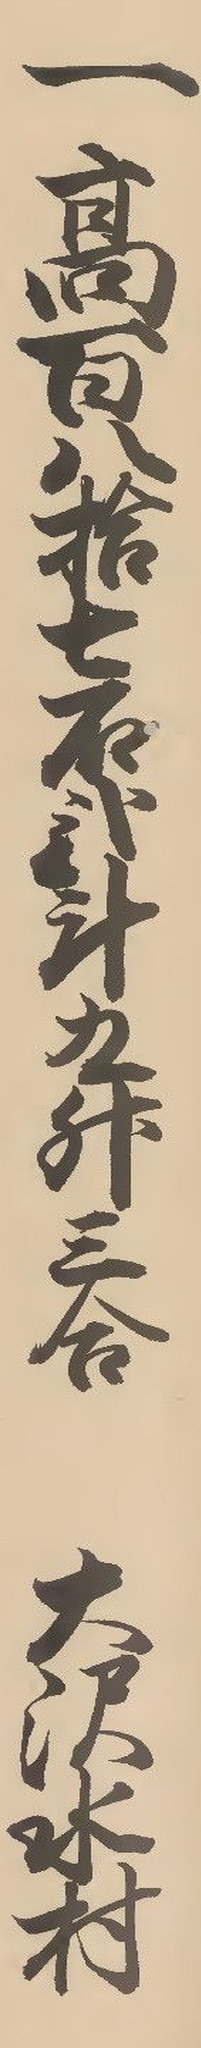一髙百八拾七石弐斗九升三合大沢水村
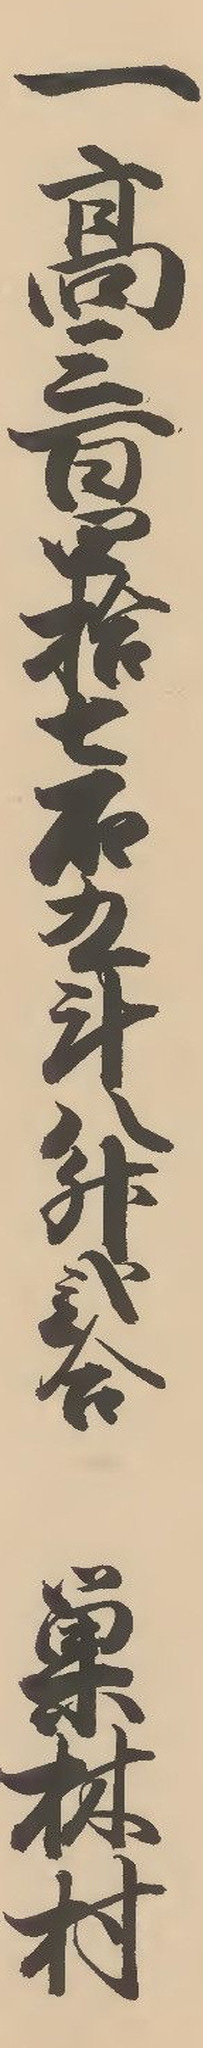一髙三百四拾七石九斗八升弐合巣林村
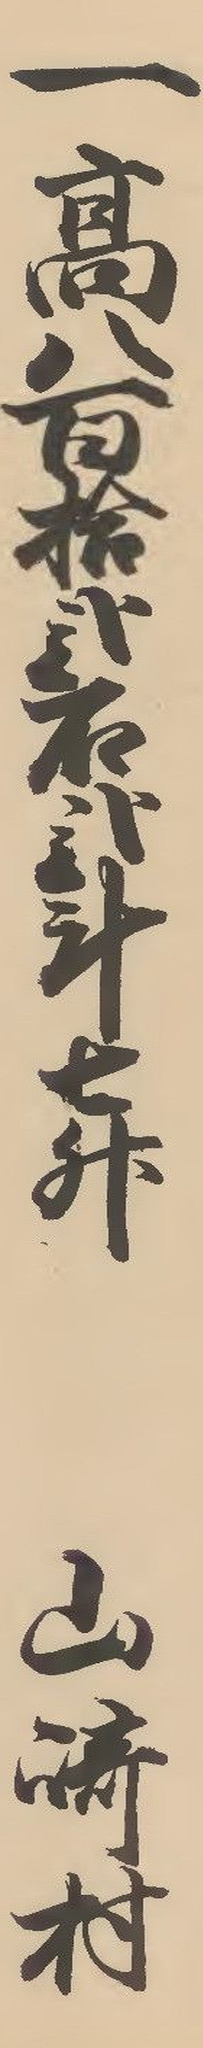一髙八百拾弐石弐斗七升山崎村
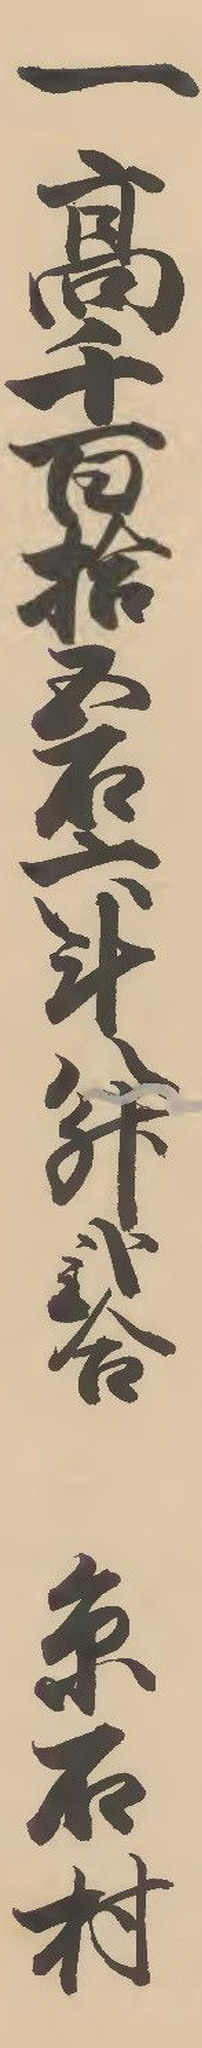一髙千百拾五石六斗八升弐合糸石村

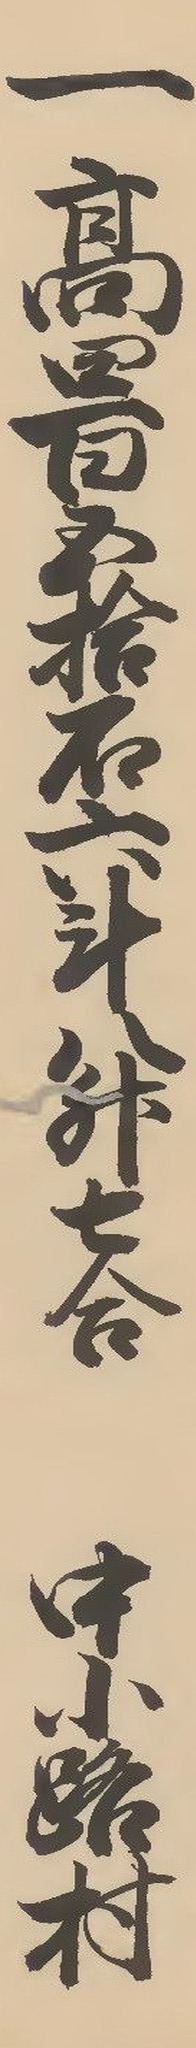一髙四百五拾石六斗八升七合中小路村
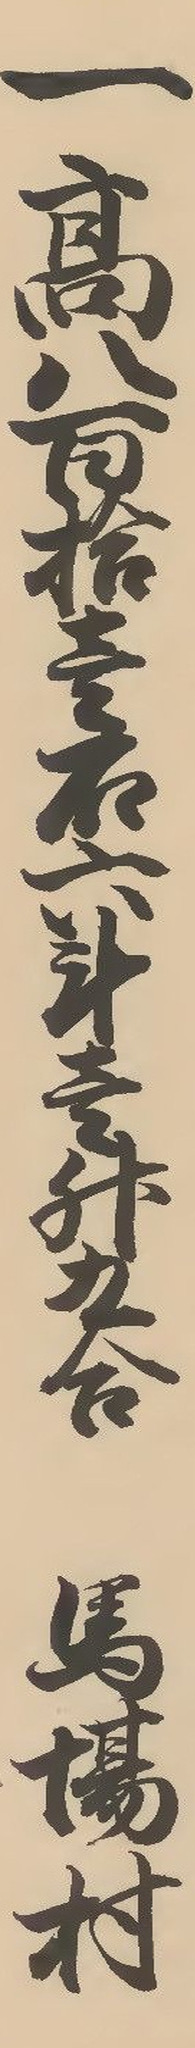一髙八百拾壱石六斗壱升九合馬場村
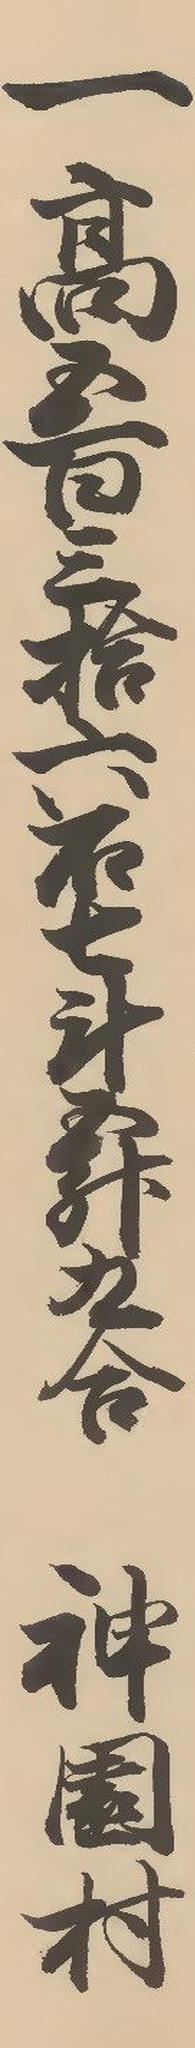一髙五百三拾六石七斗五升九合神園村
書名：肥後国郷帳
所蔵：国立公文書館 National Archives of Japan
